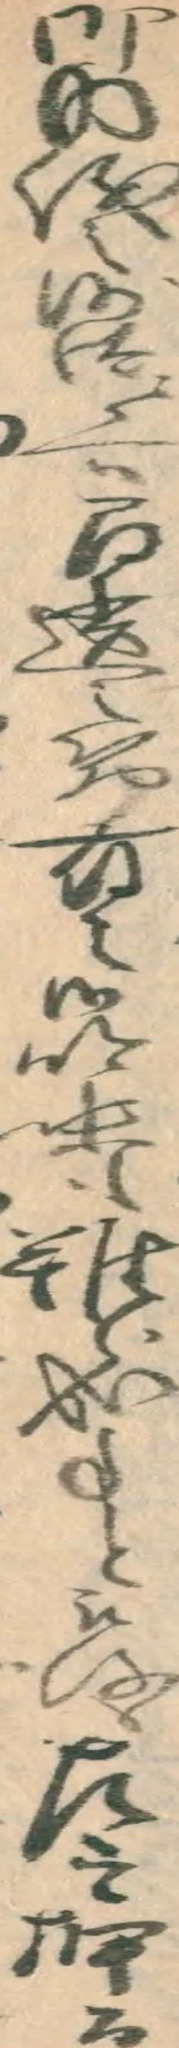御内儀之沙汰ニ候へハ間違之筋有之御吟味も難被成事と被存候左候ハヽ押而
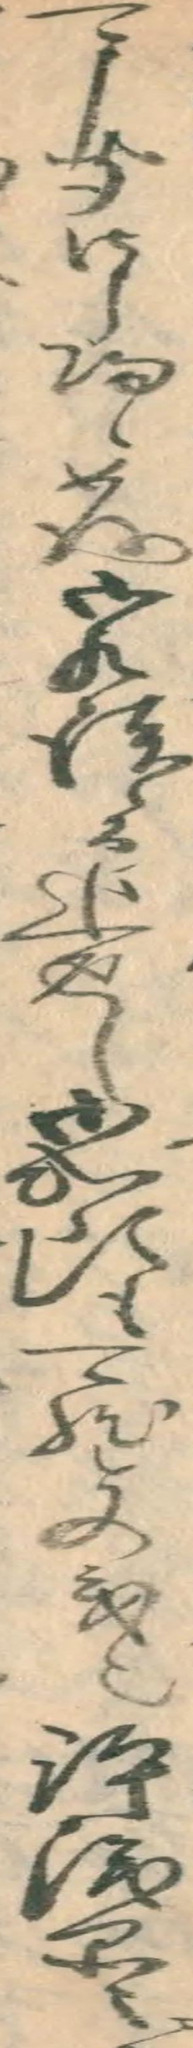可申聞由申帰候如何御相談候而追返し御出頭も可然との義也評議品々ニ而
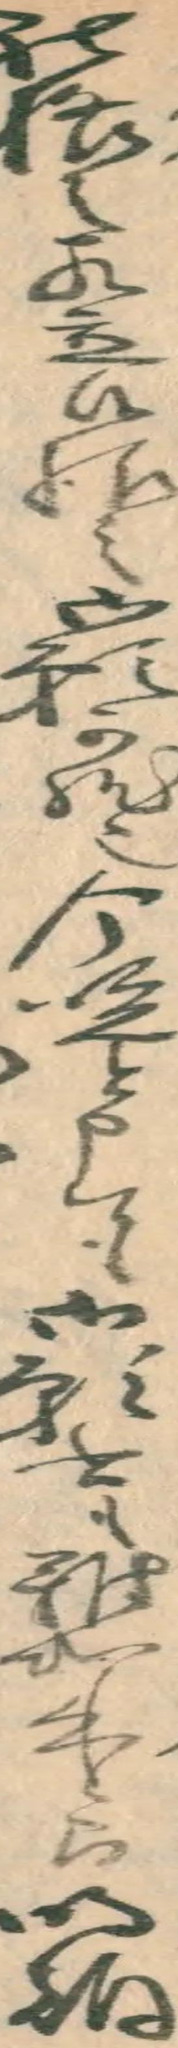社格之相立候様之御願可然也今晩と申ても御願書も難出来候間明朝
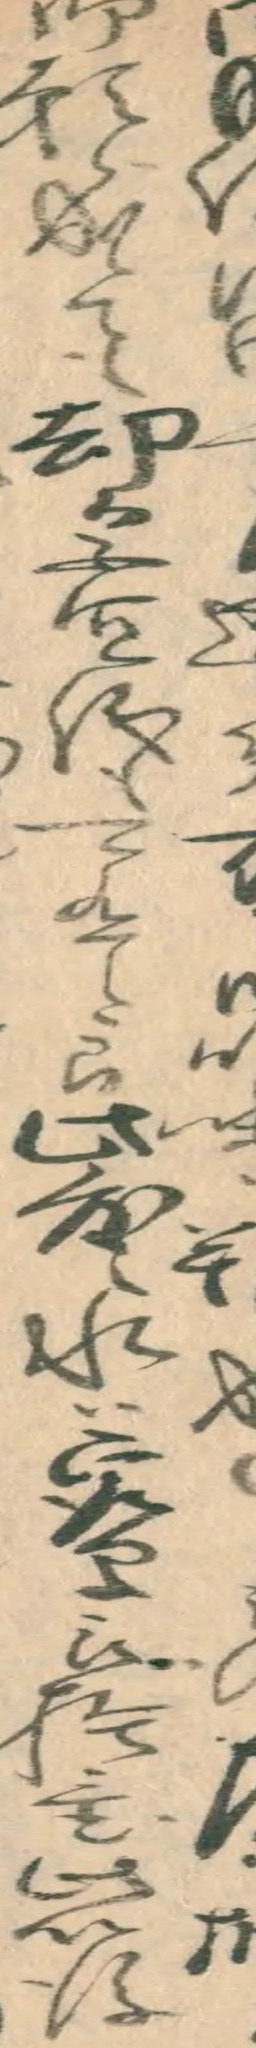御願被成候ても却而不宜儀も可有之候間此度之水ハ最早被捨置此以後
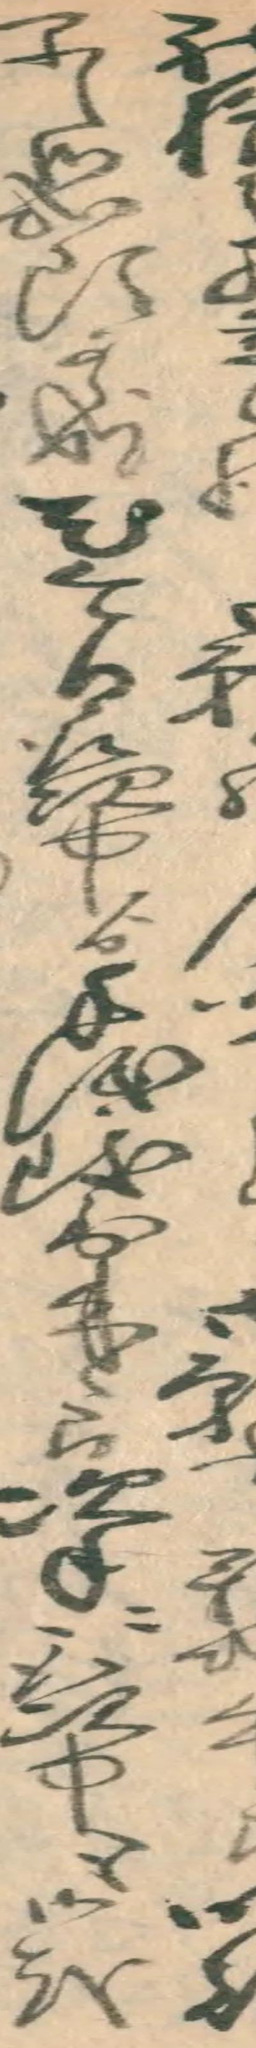早々御出頭可被成候尤今日取次中ゟ手紙致到来候間次手ニ取次中へも御越
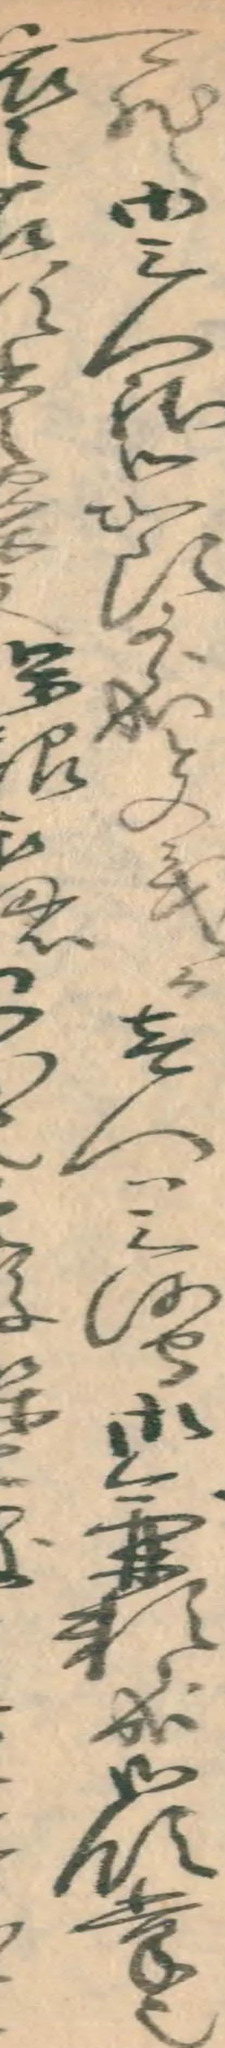可然候御三人様御出頭可被成との義ニ而壱人ハ三河守御兼頼被成御領掌也
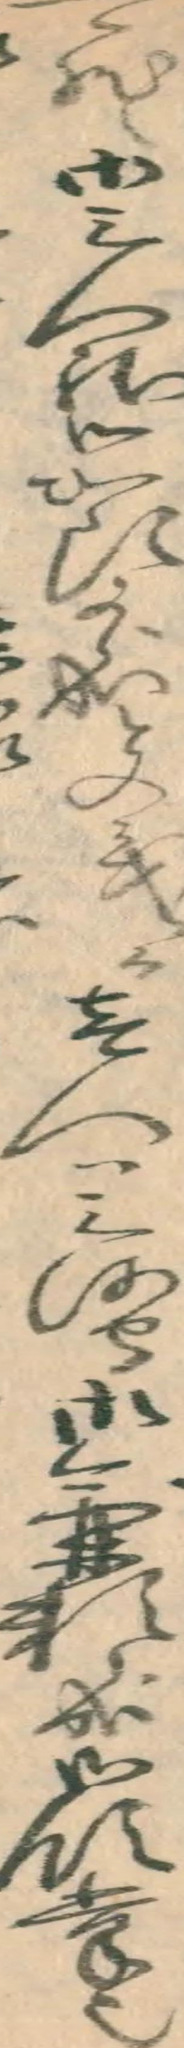可然候御三人様御出頭可被成との義ニ而壱人ハ三河守御兼頼被成御領掌也
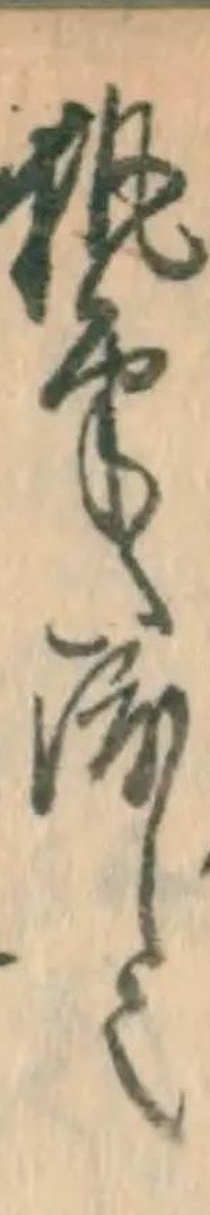執筆へ渡候也
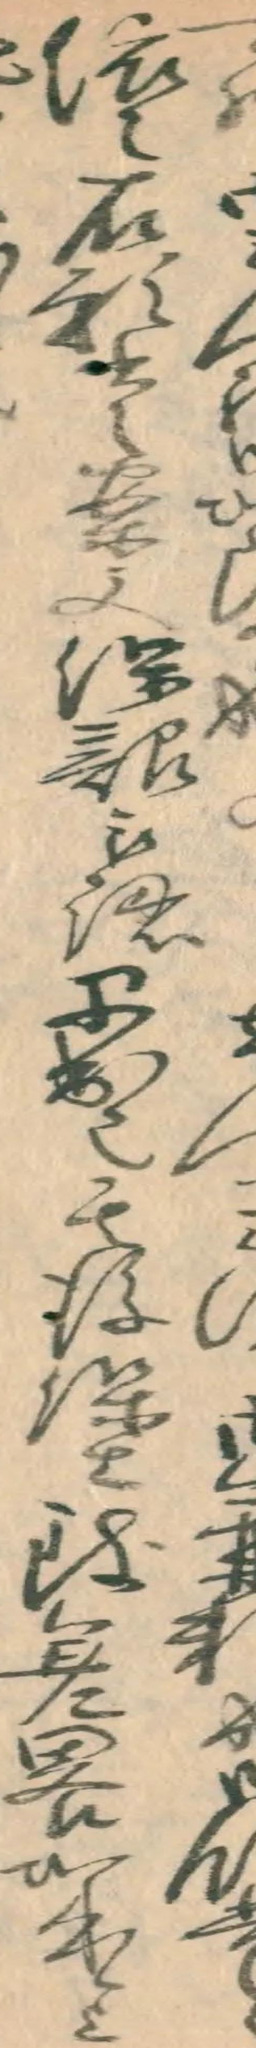依之右願書之案文保韶被認早出也其後保土致差略出来候上
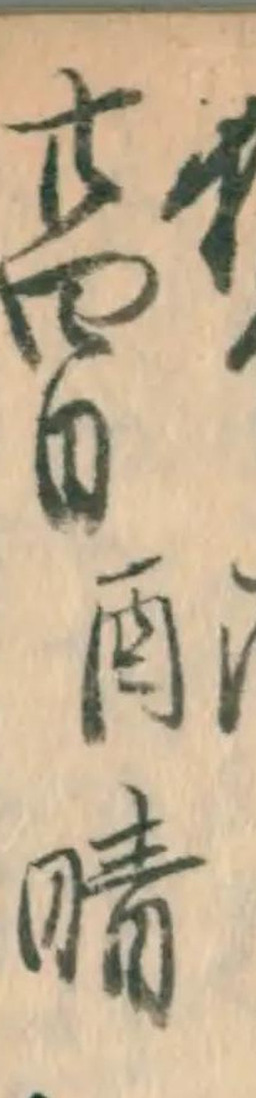廿四日酉晴
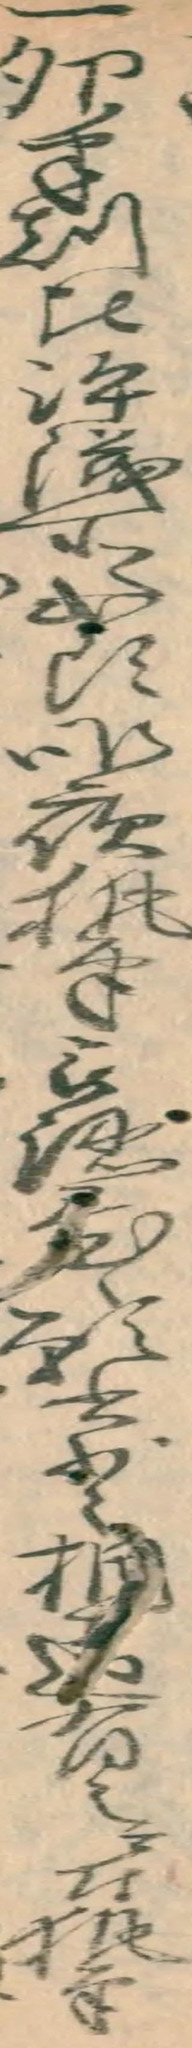一卯ノ半刻比評議所へ出頭昨夜執筆被認置候願書少々相違有之ニ付執筆
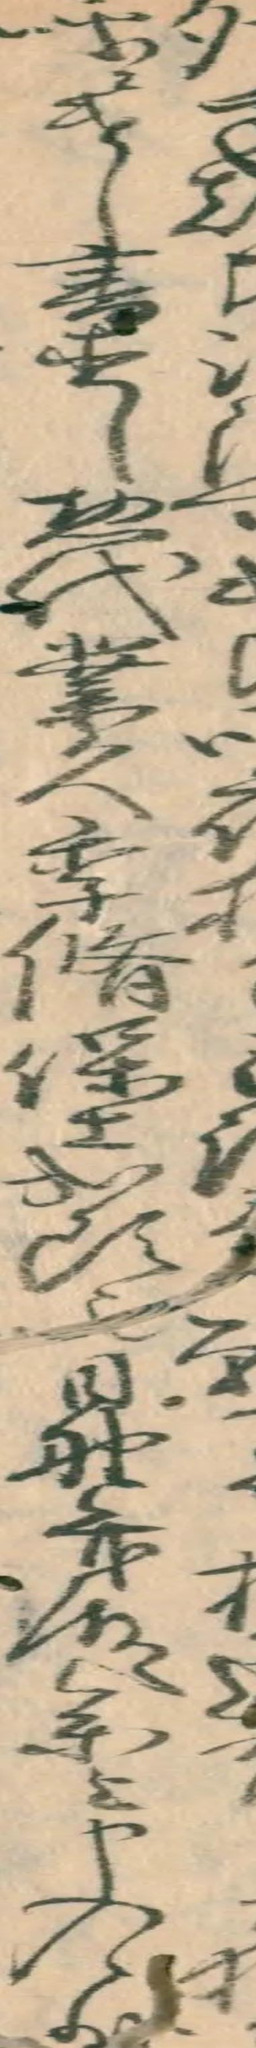呼ニ遣し書直し惣代業久季脩保士出頭也日野弁殿へ参上申入候処
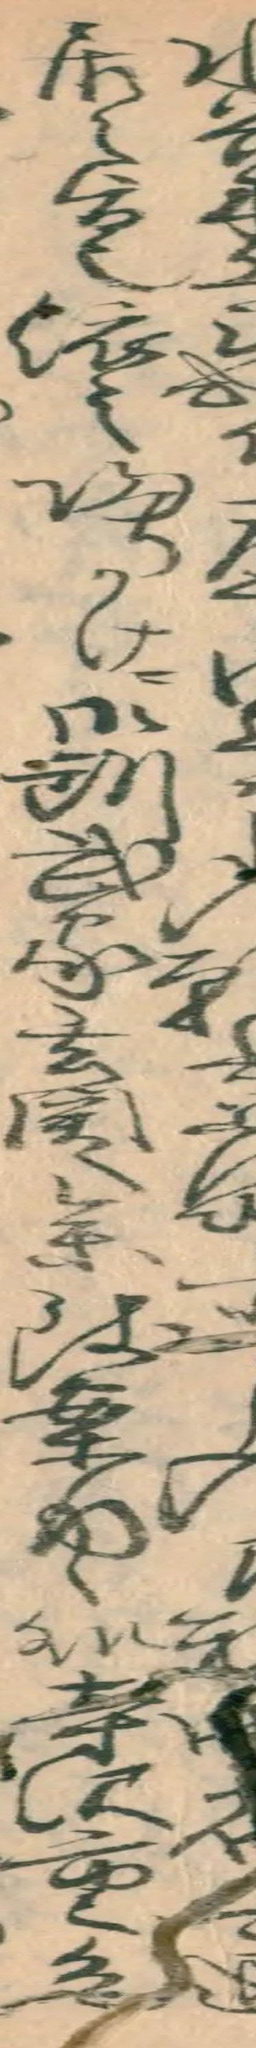居之旨也依之帰りかけニ御所武家玄関へ参致案内候処寺沢市之進？
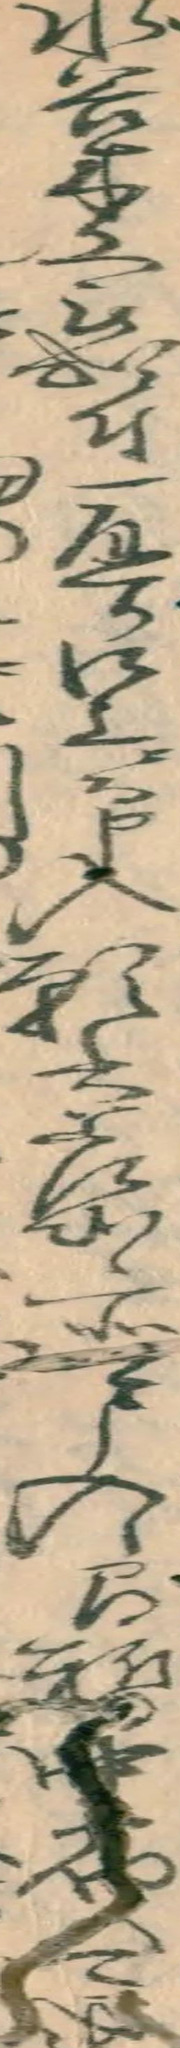水谷木工被出ニ付一通り口上ニ而申入願書差出候所可申入候間暫中宿へ可退
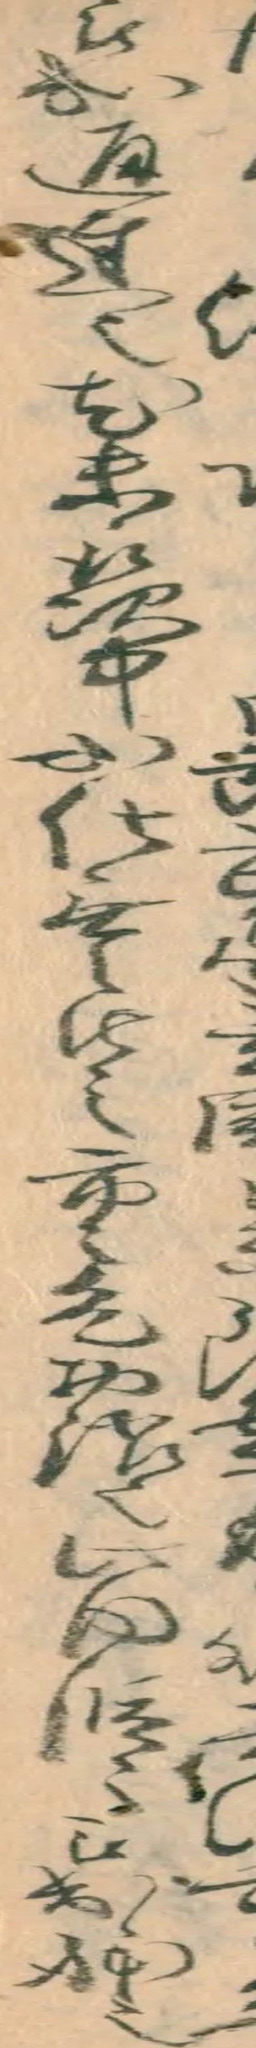被出通達也尤未取次中出仕無之由也市之進物語也此内段々被出候体也
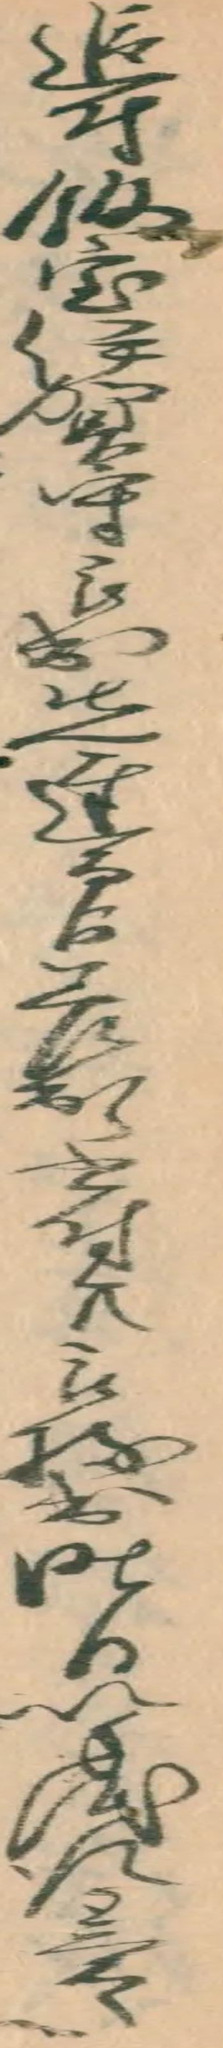追付飯室伊賀守被出先達而ゟ差出候書付共被持出昨日以手紙得御意候
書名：賀茂社記録. 第58冊
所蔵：国立国会図書館 National Diet Library, JAPAN
